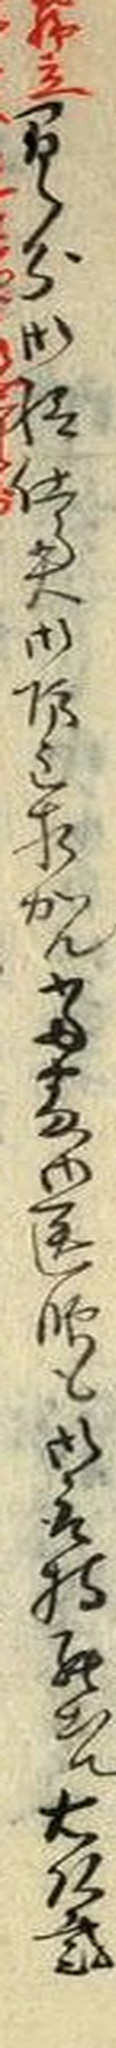間之分御給仕奥御坊主相加ル当番御医師も御取持罷出ル右頂戴
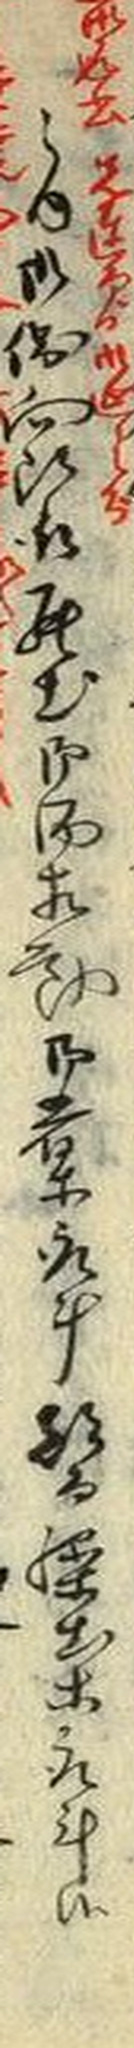之内御側向頭取罷出御酒相勧御肴等取計都而繰出等取計候
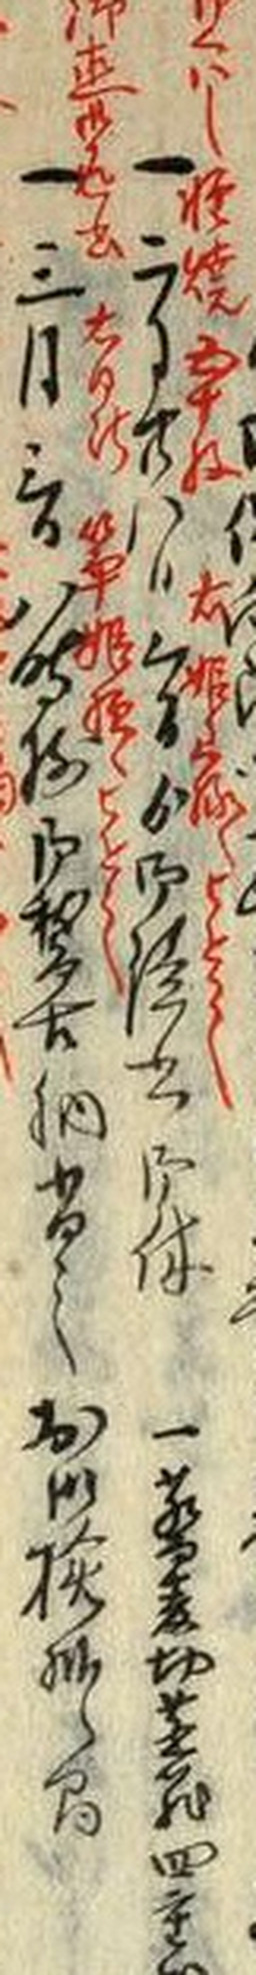一三月三日八時揃御稽古納有之於御槍掛之間
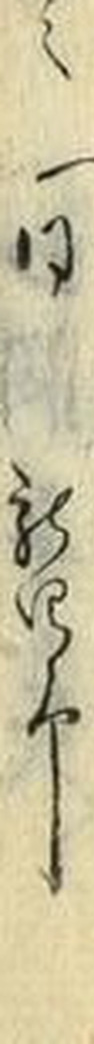同新四郎
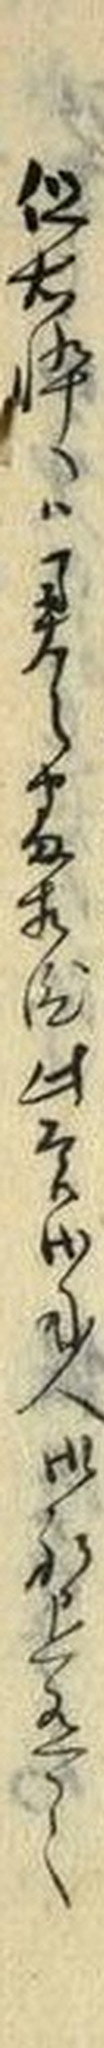但右忰ヘハ奥之番相渡此節御用人御礼申上有之
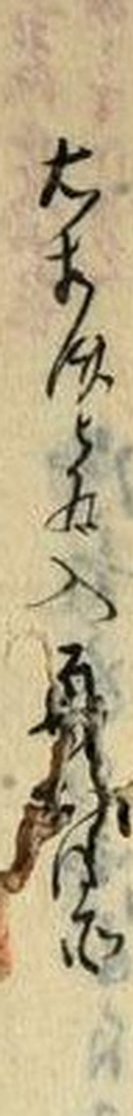右相済被為入再同所

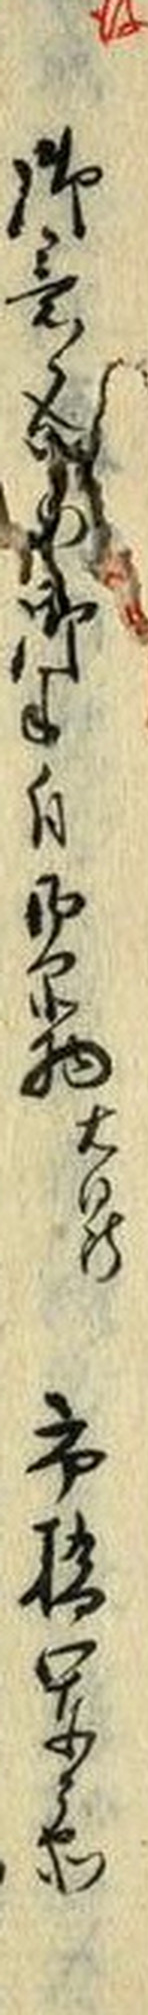御意被成下御手自御品物右同断市橋軍兵衛
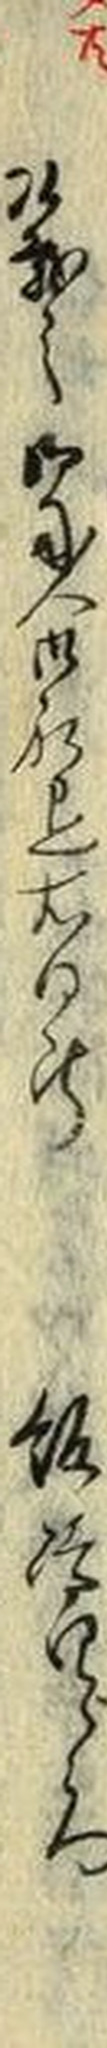頂戴之御用人御礼申上右同断飯嶋四郎右衛門
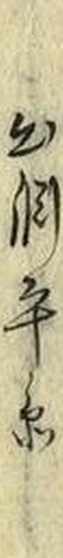出淵平兵衛
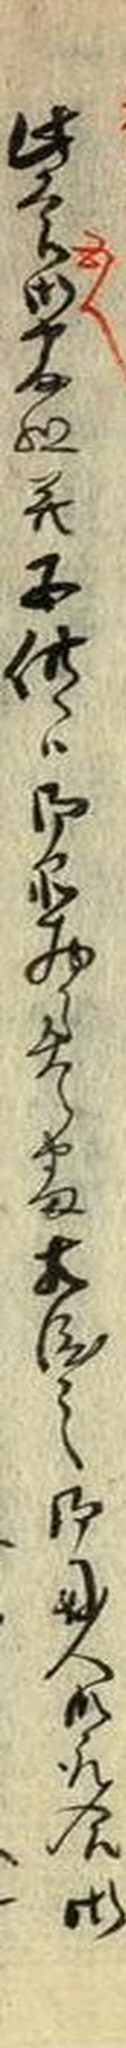此節御番組幷子供ヘハ御品物奥之番相渡之御用人御取合御
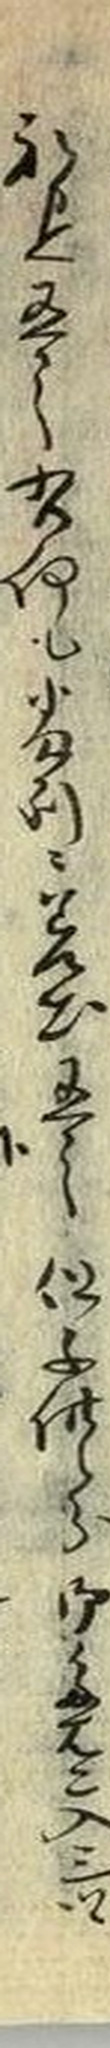礼申上有之右何も番列ニ差出有之但子供之分御たはこ入三ツヽ
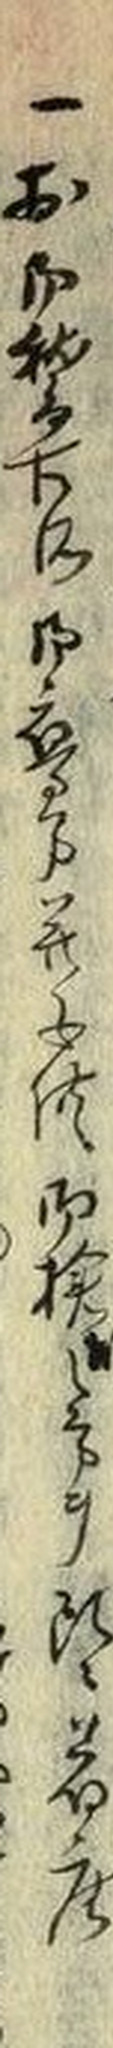一於御稽古所御鷹方幷子供御槍掛之方ヲ頭ニ着座
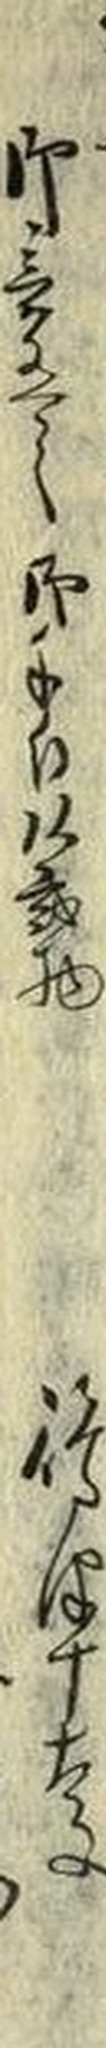御意有之御手自頂戴物嶋津十太夫
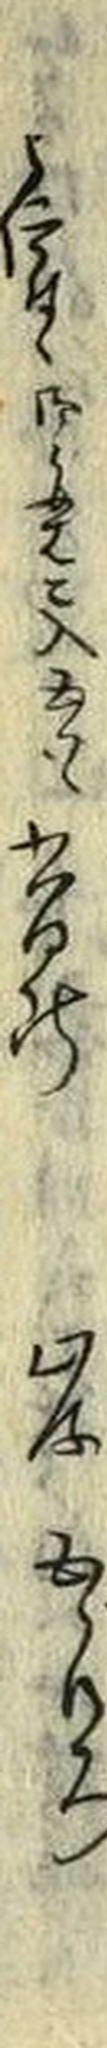被仰付候御たはこ入五ツヽ右同断岸五郎左衛門
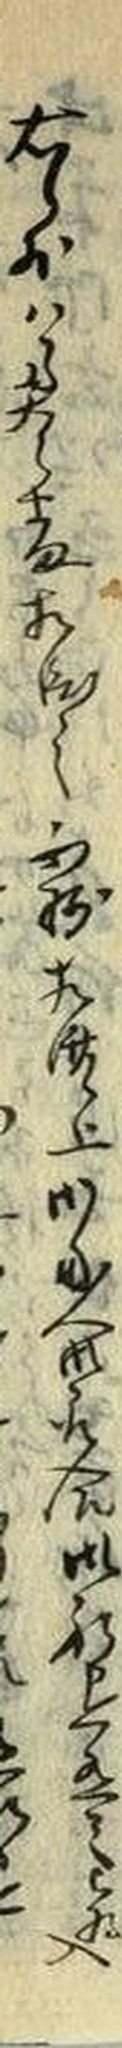右之外ハ奥之番相渡之不残相済候上御用人御取合御礼申上有之被為入
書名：少傅日録抄（斉承付側向頭取日記、在国）
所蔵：福井県文書館 Fukui Prefectural Archives
